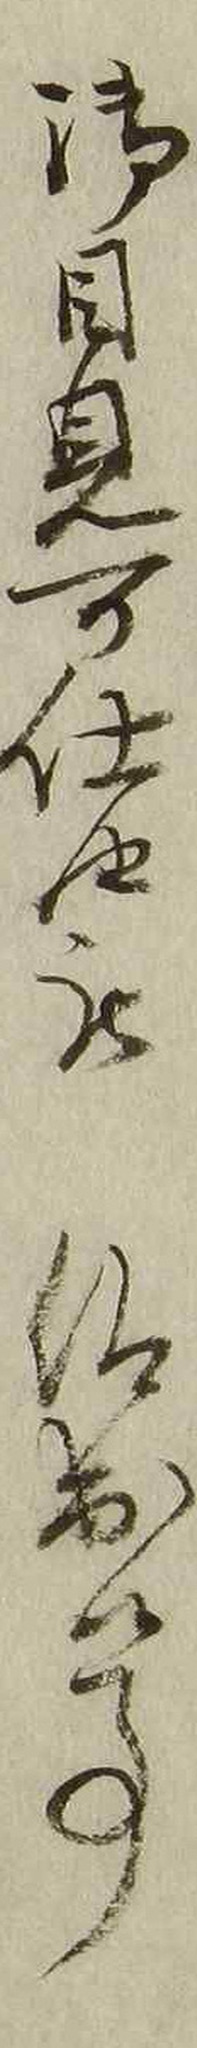御目見可仕由被仰出候事
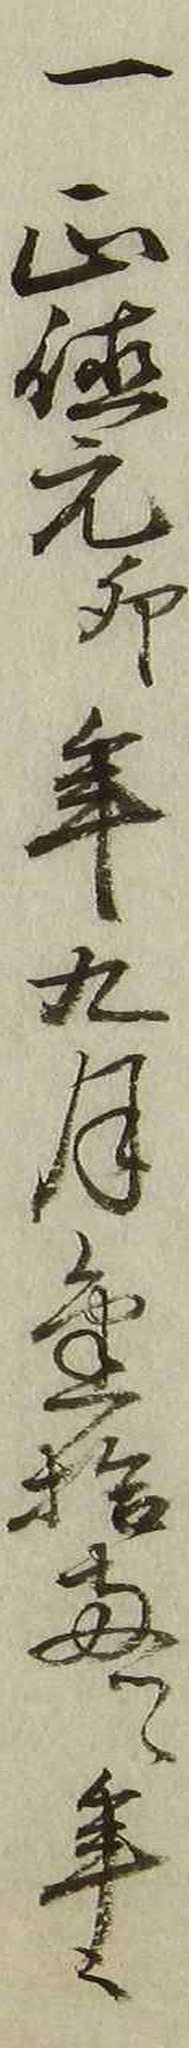一正徳元卯年九月金拾両ツヽ年々
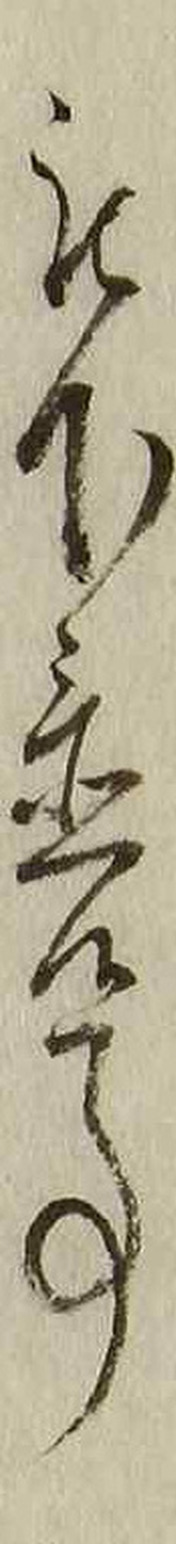被下置候事
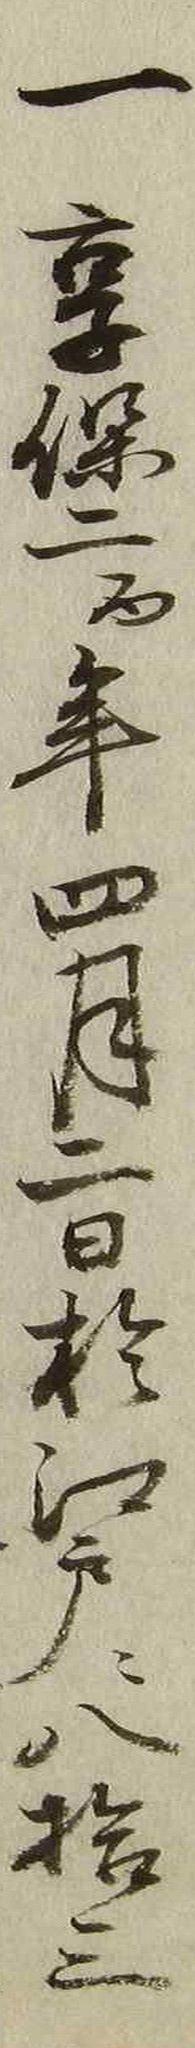一享保二酉年四月二日於江戸ニ八拾三
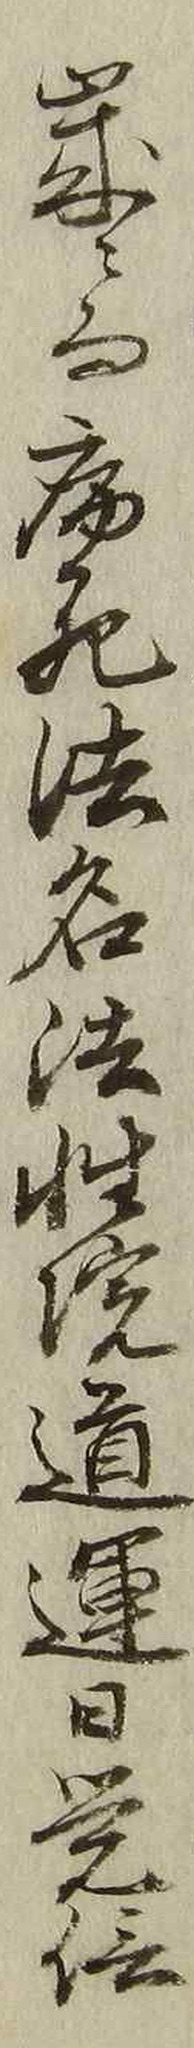歳ニ而病死法名法性院道運日覚信
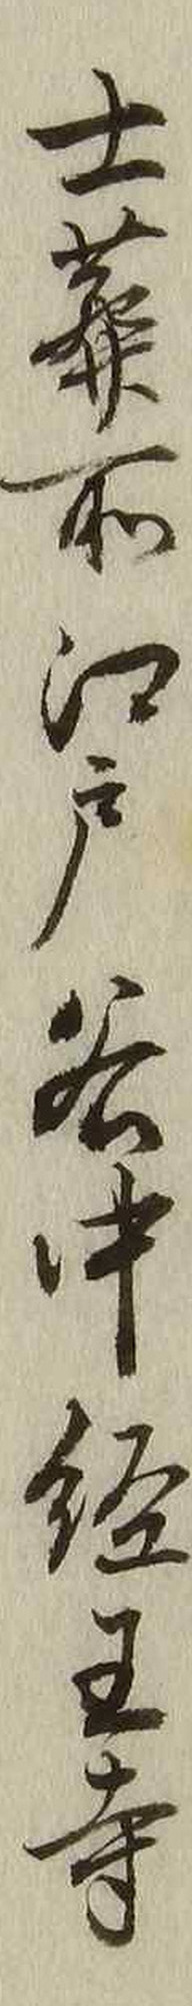士葬所江戸谷中経王寺
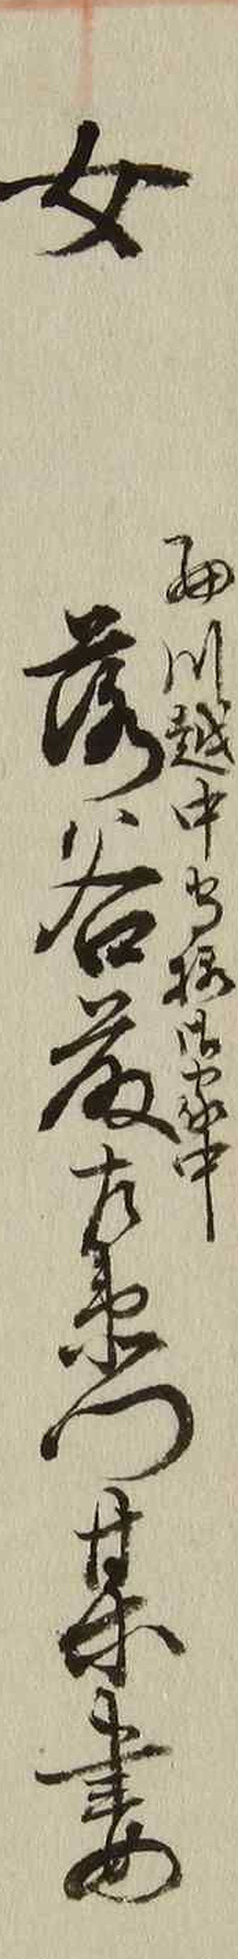女落谷藤左衛門某妻
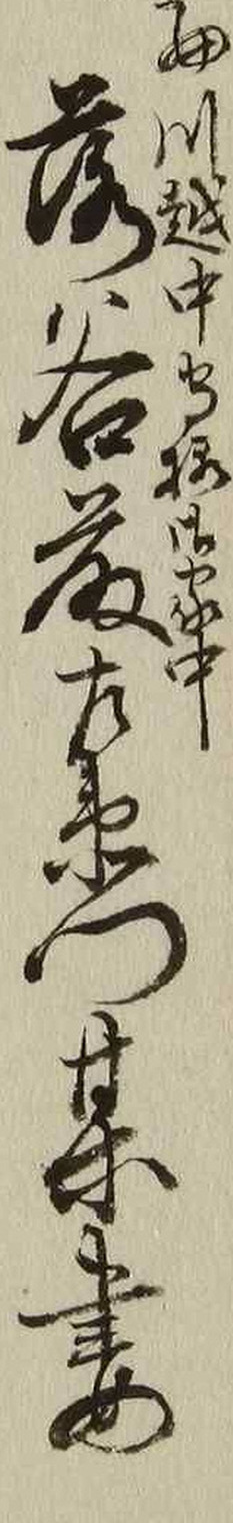女落谷藤左衛門某妻
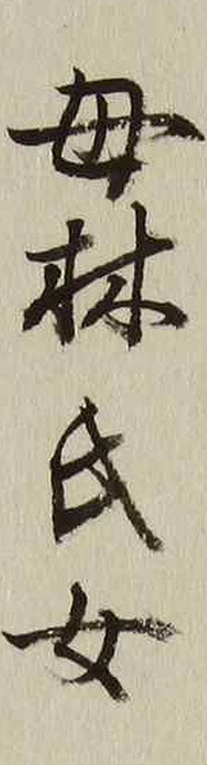母林氏女
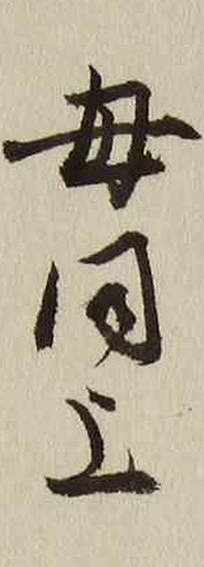母同上
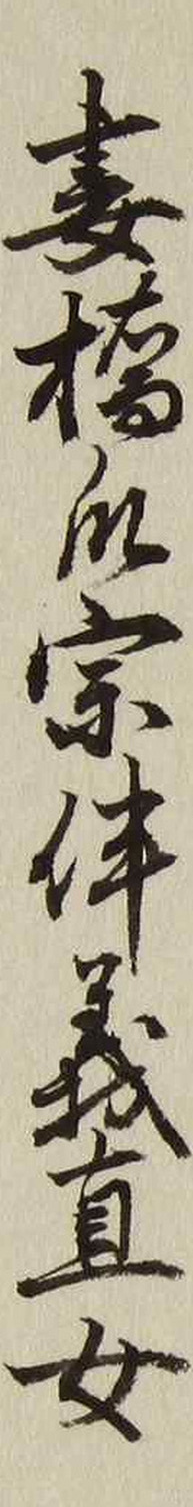妻橋爪宗伴義直女
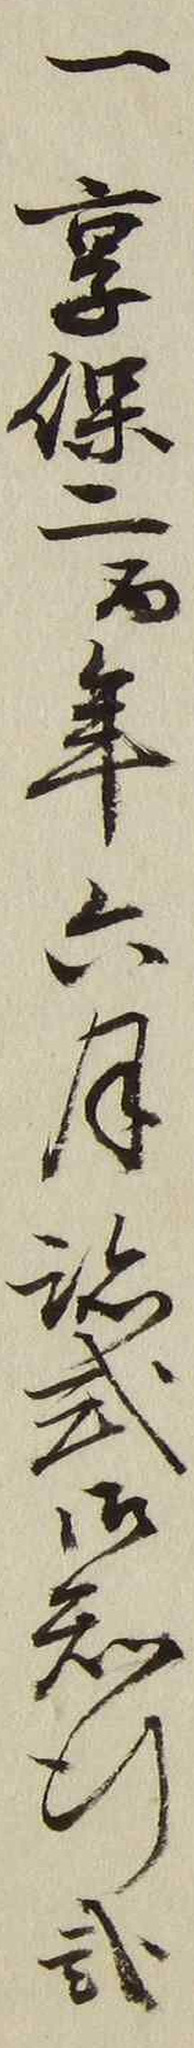一享保二酉年六月跡弐御知行弐

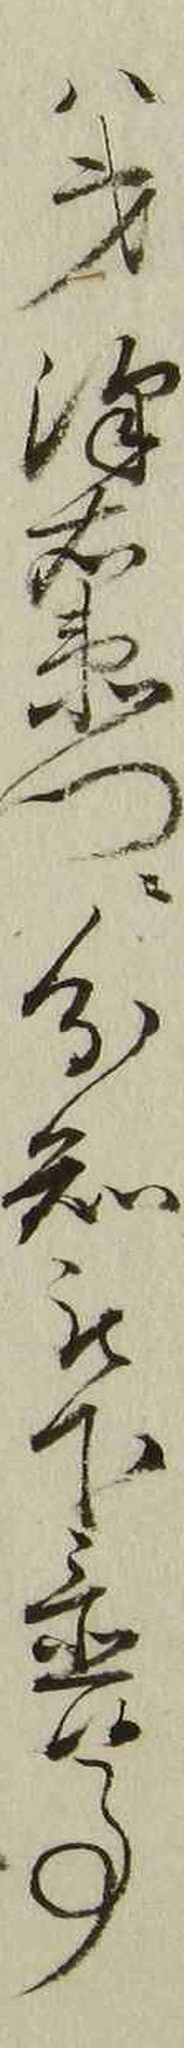ハ弟沢右衛門ニ分知被下置候事
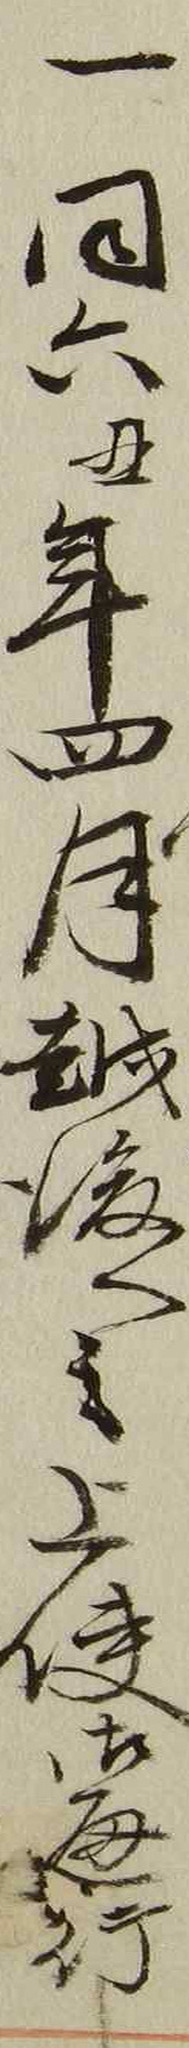一同六丑年四月越後へ之上使御通行
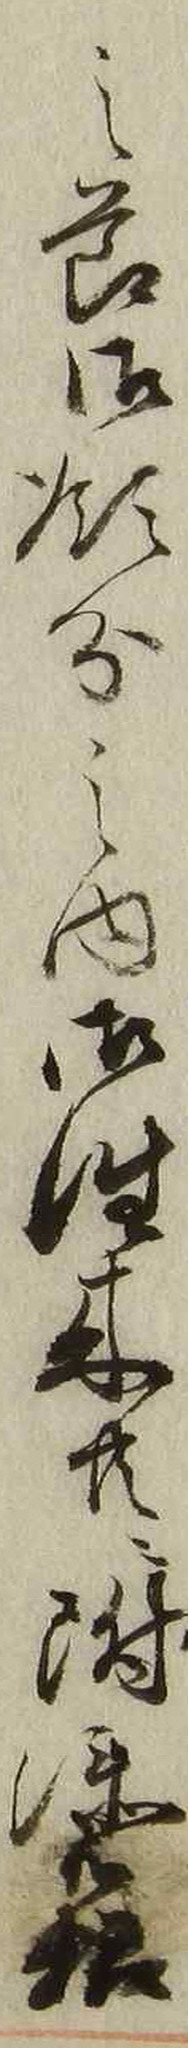之節御領分之内御往来共ニ附添候様
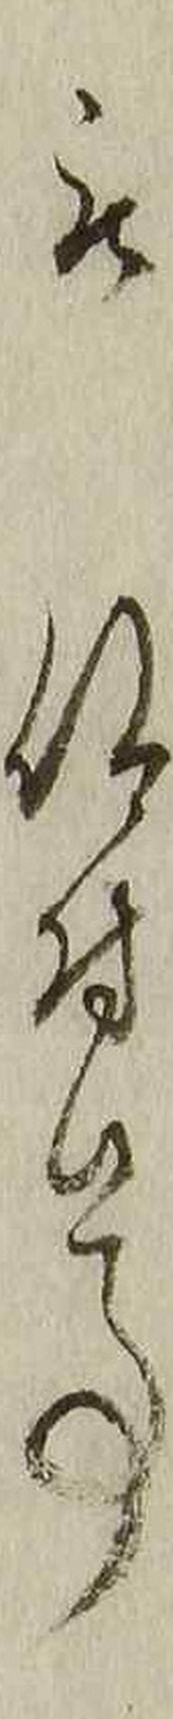被仰付候事
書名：諸士系譜　巻之39　は之部7
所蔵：会津若松市立会津図書館
